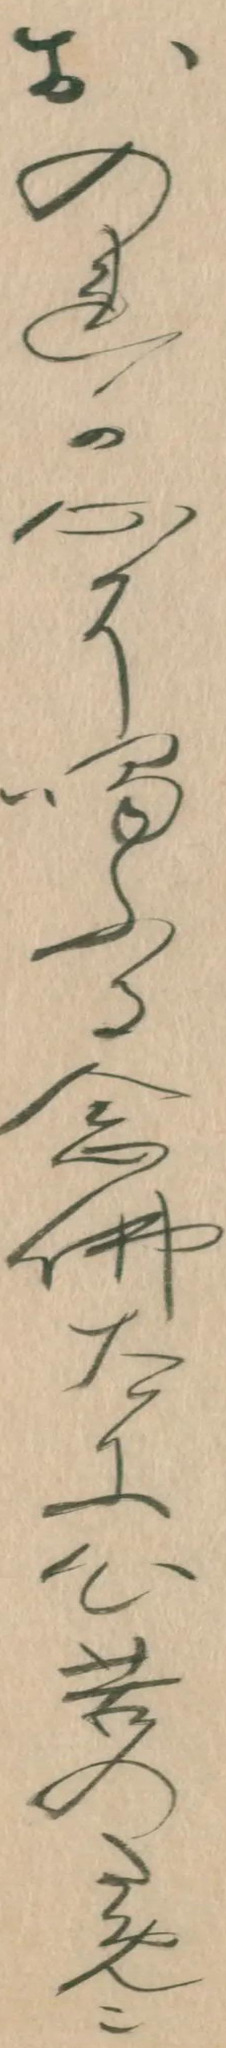おのれか心に唱ふる念仏たに心苦のために
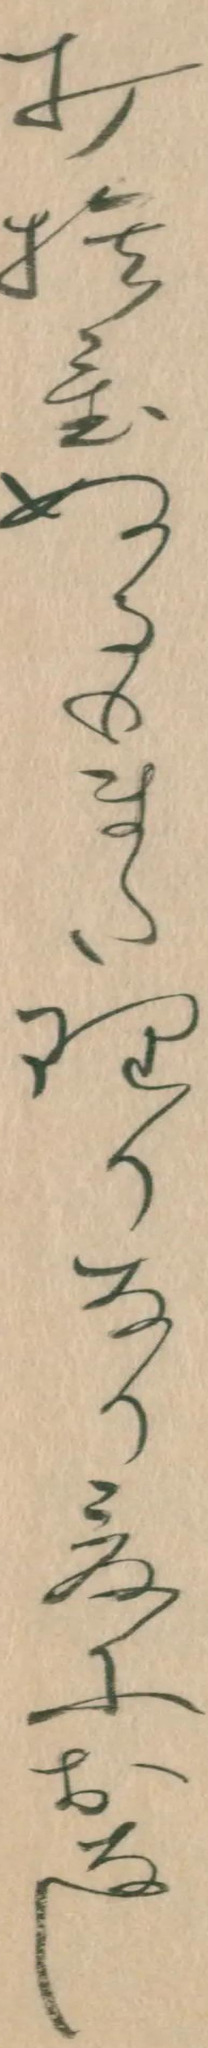打捨置ぬるもまた理りなり爰におなし
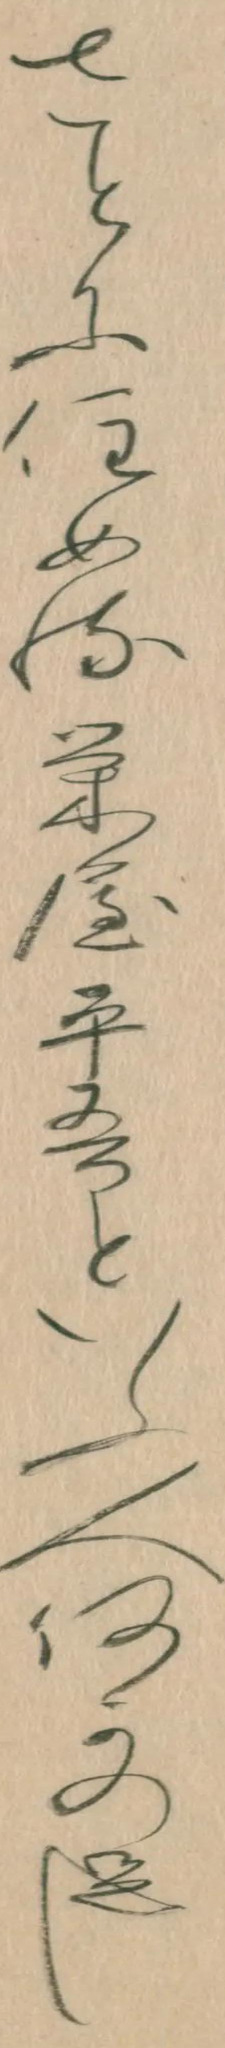さとに住める栄屋平吾といふ人何かの足し
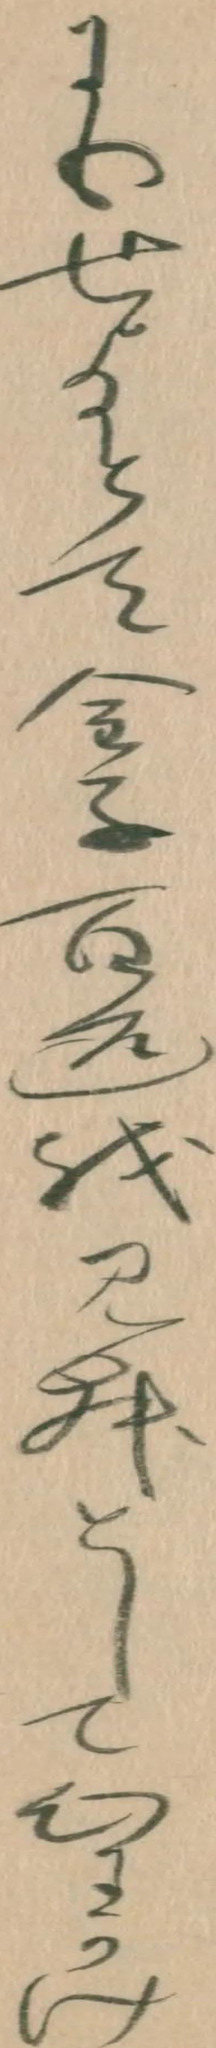にもせよとて金子百疋を見舞として心にかけ
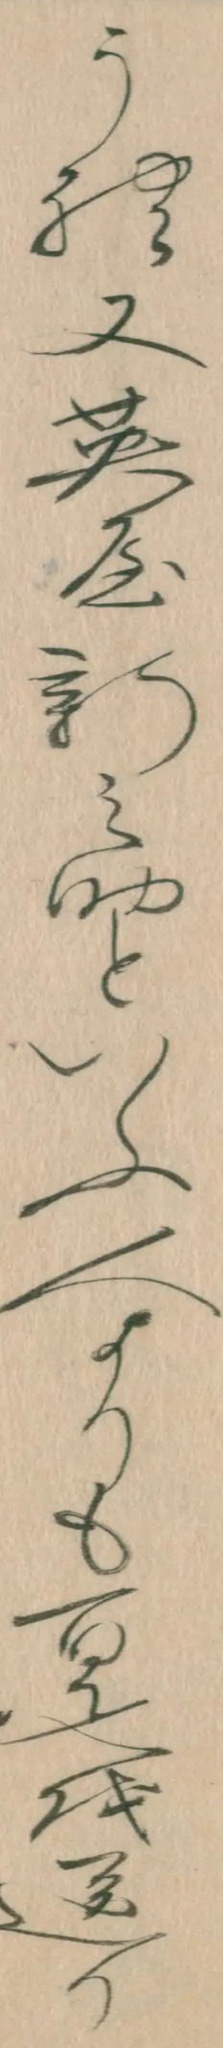られ又英屋新之助といふ人よりも百疋を送り
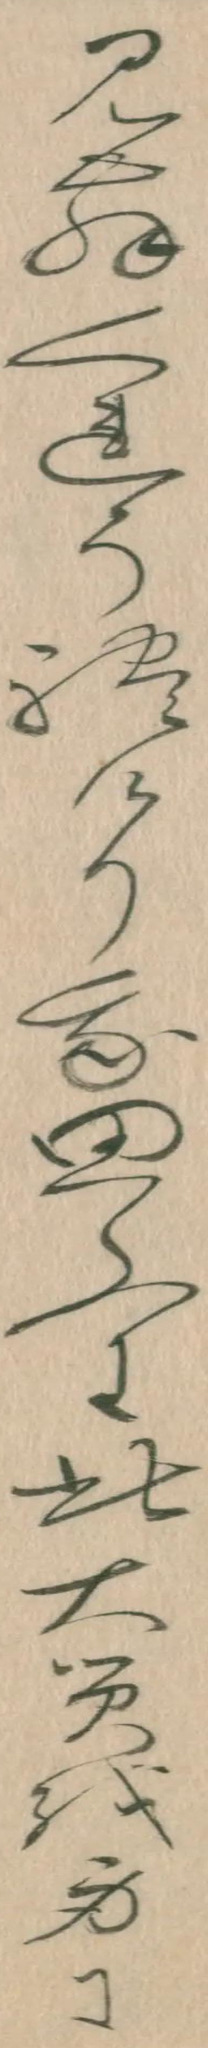見舞くれられけり我思ふに此大災を身に
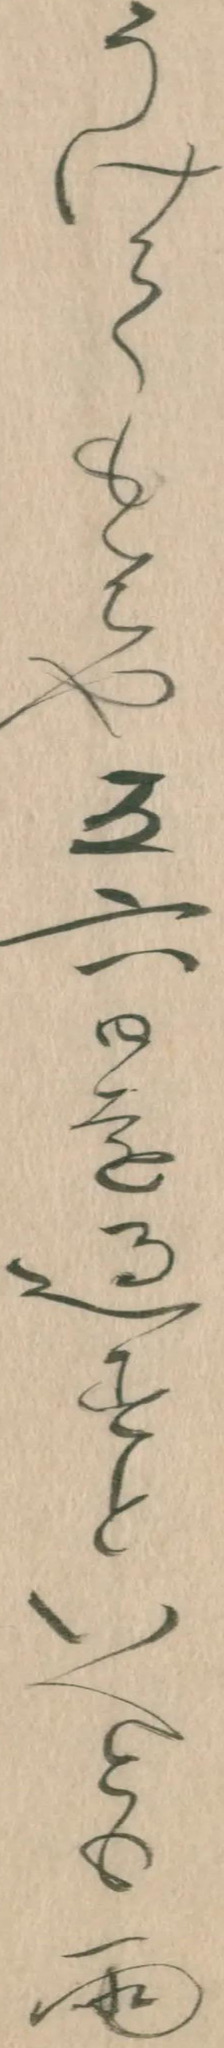うけてもはや五六日を過すといへとも雨
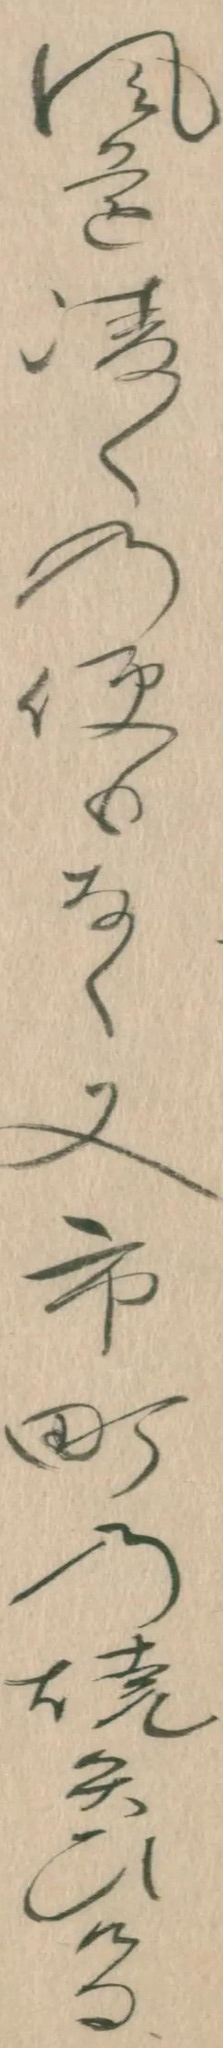風を凌くの便もなく又市町の焼失ひける
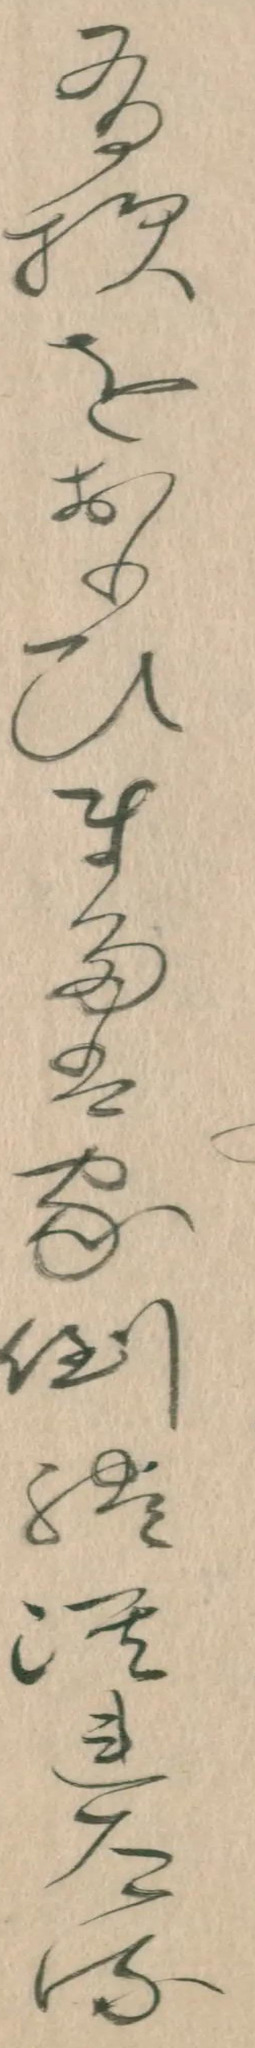有様をおもひまたは家倒れ潰れたる
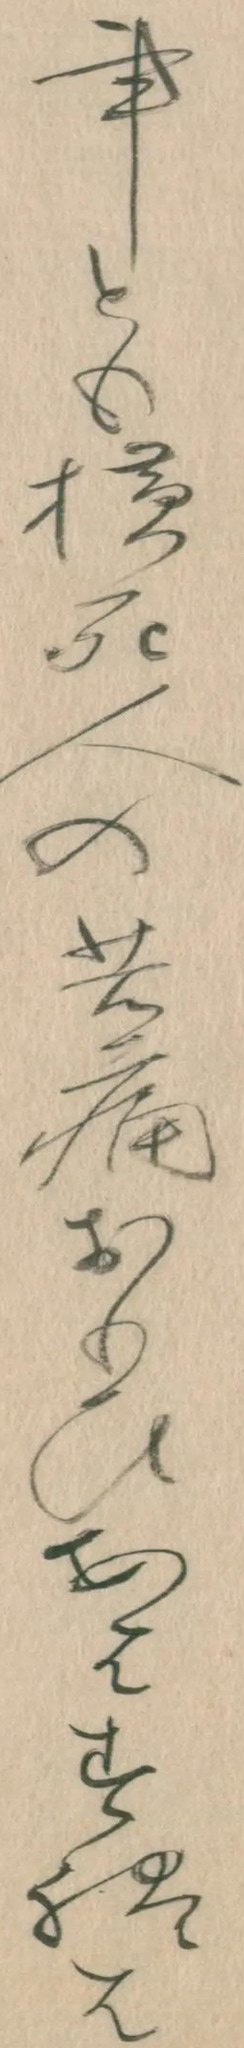事とも横死人の苦痛おもひあはすれは
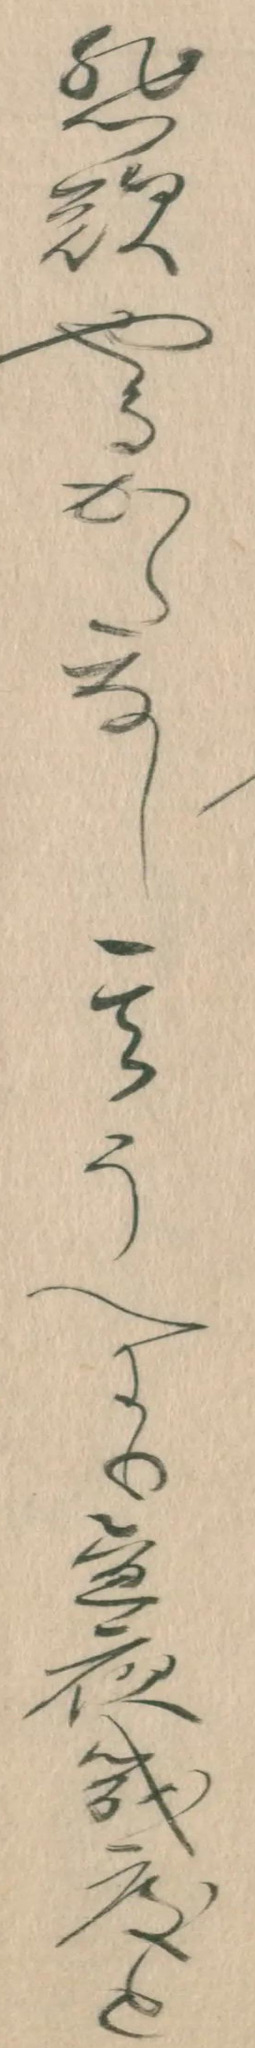愁歎やるかたなし其うへにも昼夜幾度と
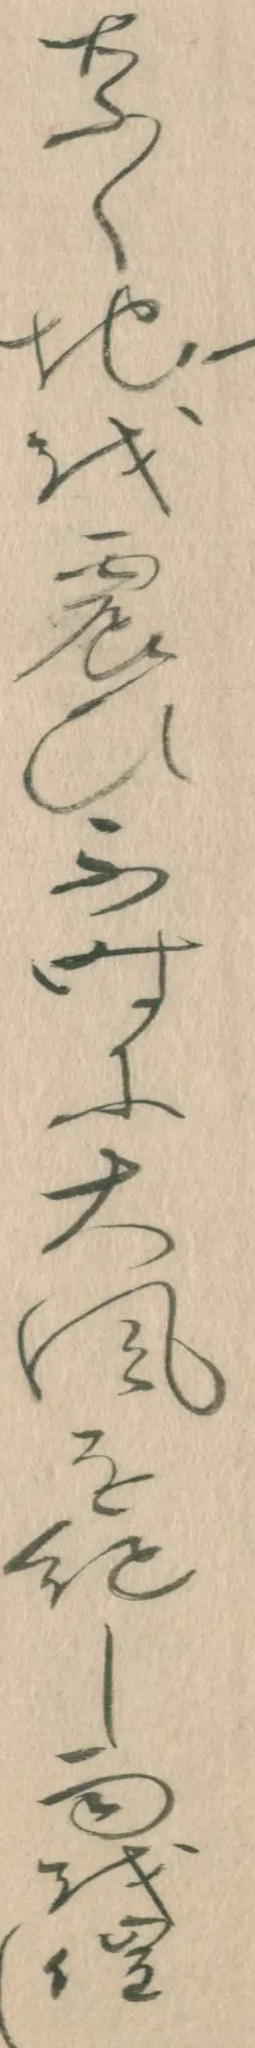なく地を震ひ不時に大風を起し雨を催し
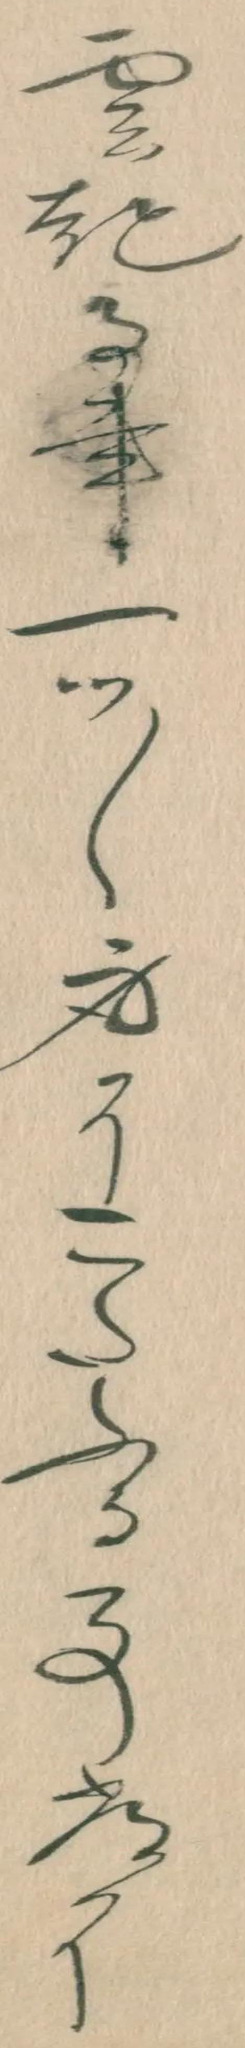雲起る事一つ〳〵身にこたふる事常に
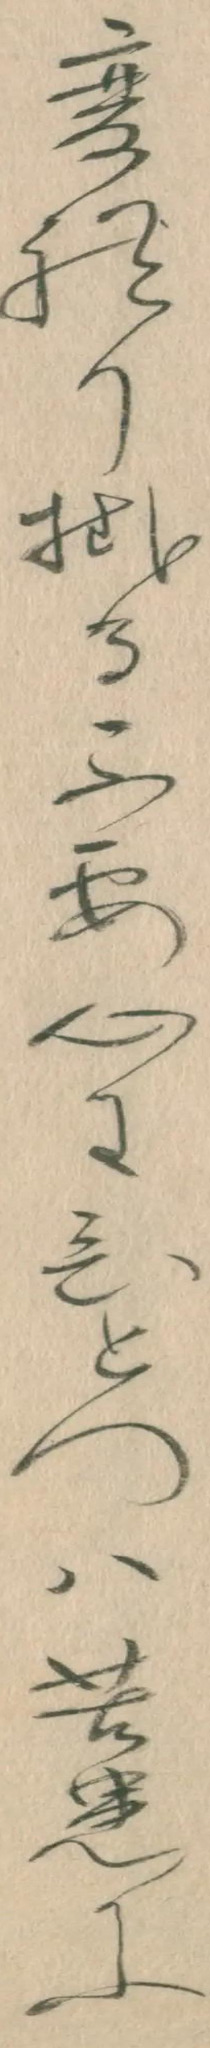変れり掛る不安心にひとつは苦患に

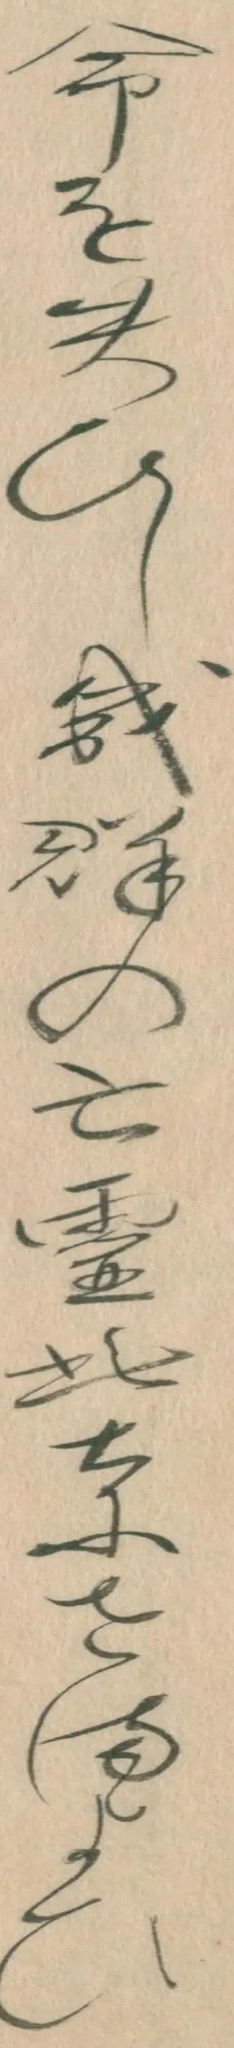命を失ひし幾群の亡霊此ちにさまよひ
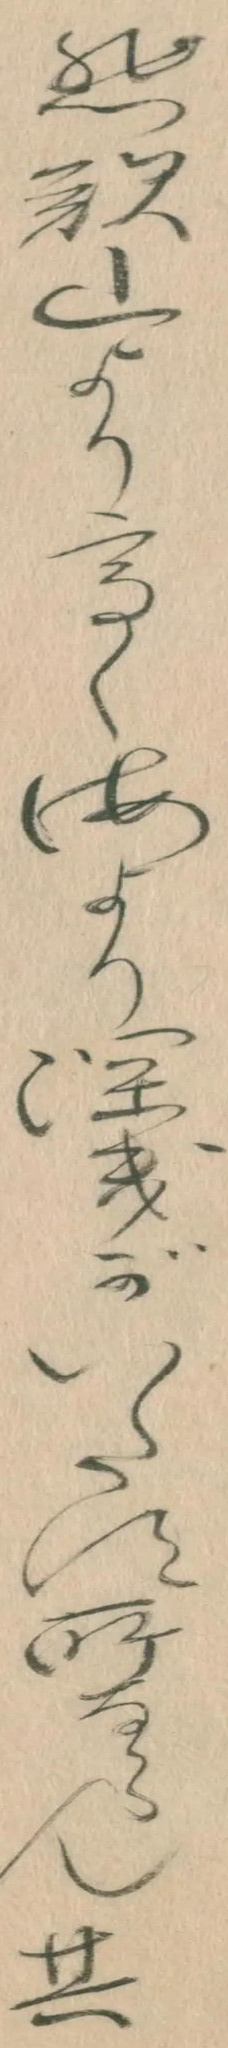愁歎山より高く海より深きがいたす所ならん共
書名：俗語之種. [5]
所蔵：国立国会図書館 National Diet Library, JAPAN
